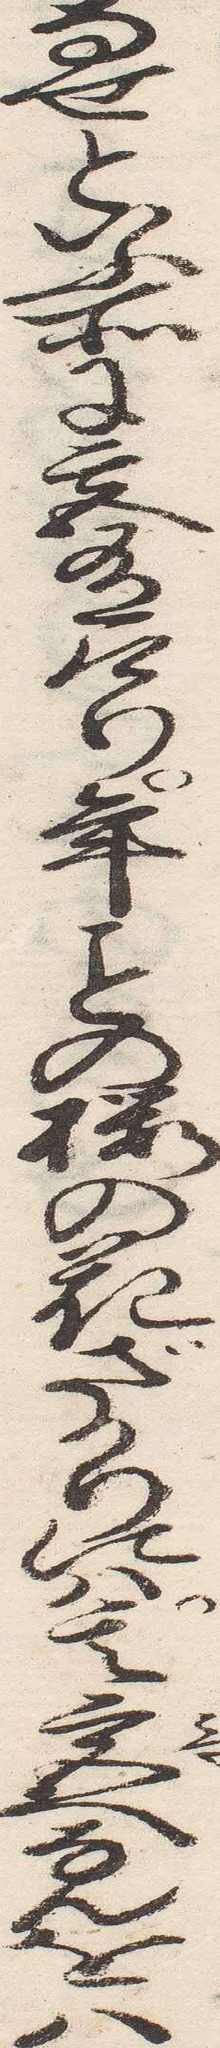なせといふ所に宮有けり。年ことの桜の花ざかりには。其宮へなんをは
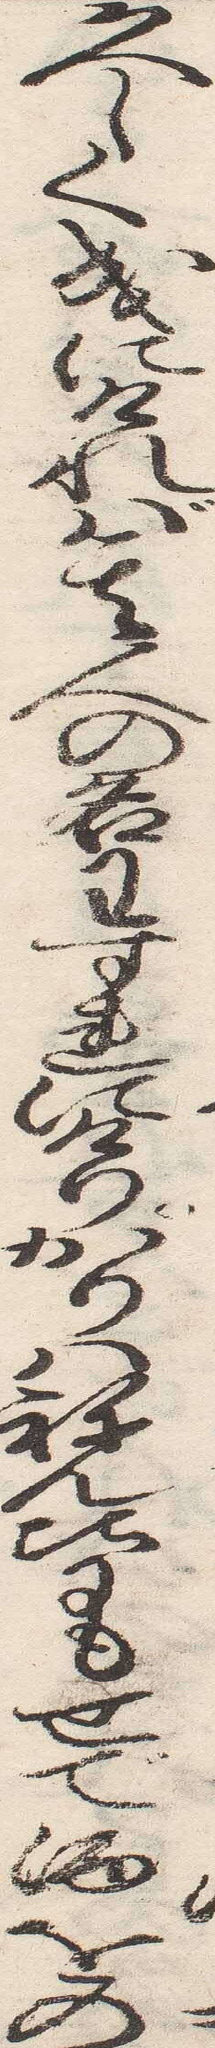久しく成にければ其人の名わすれにけり。かりはねん比にもせで酒をの
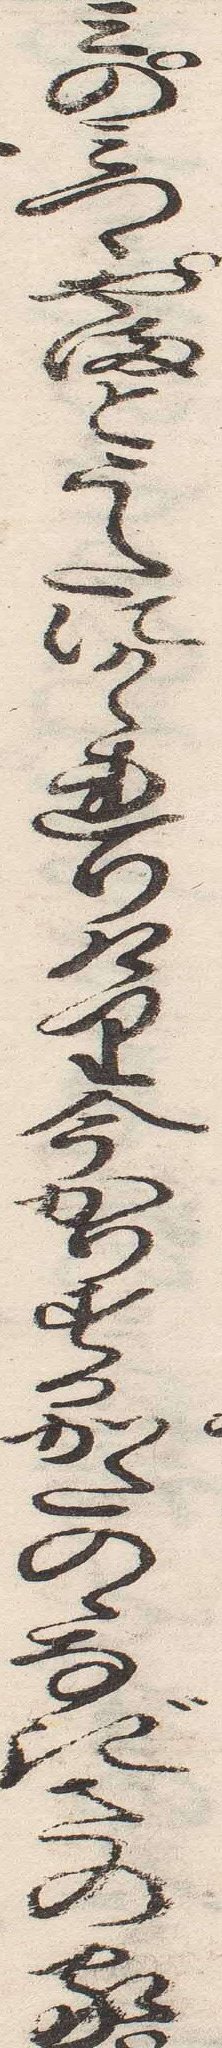み。のみつゝ。やまとうたにかゝれりけり今かりするかたのゝなぎさの家。
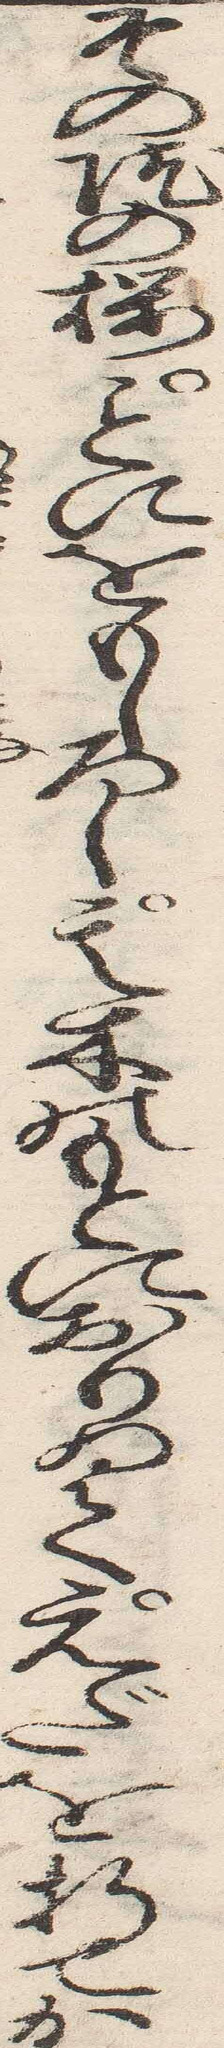その院の桜。ことにをもしろし。其木のもとにおりゐて。えだを折てか
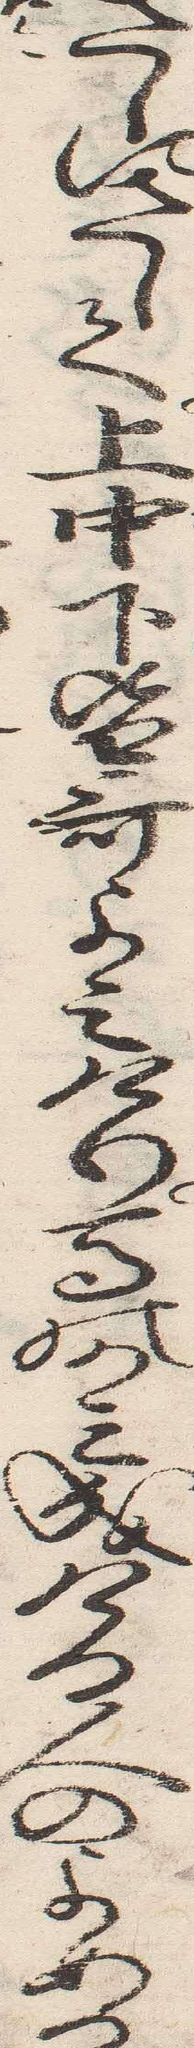ざしにさして。上中下皆哥よみけり。馬のかみ成ける人のよめる
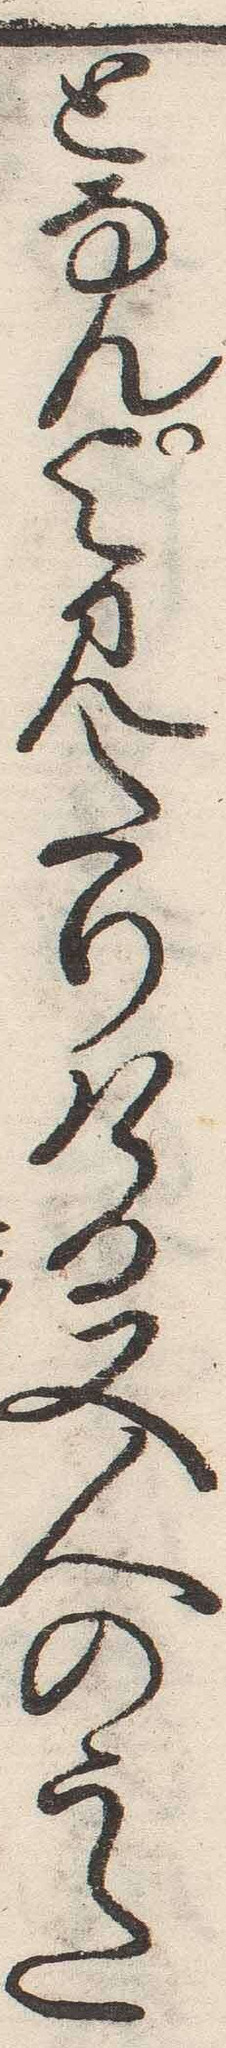となん。よみたりける又人のうた
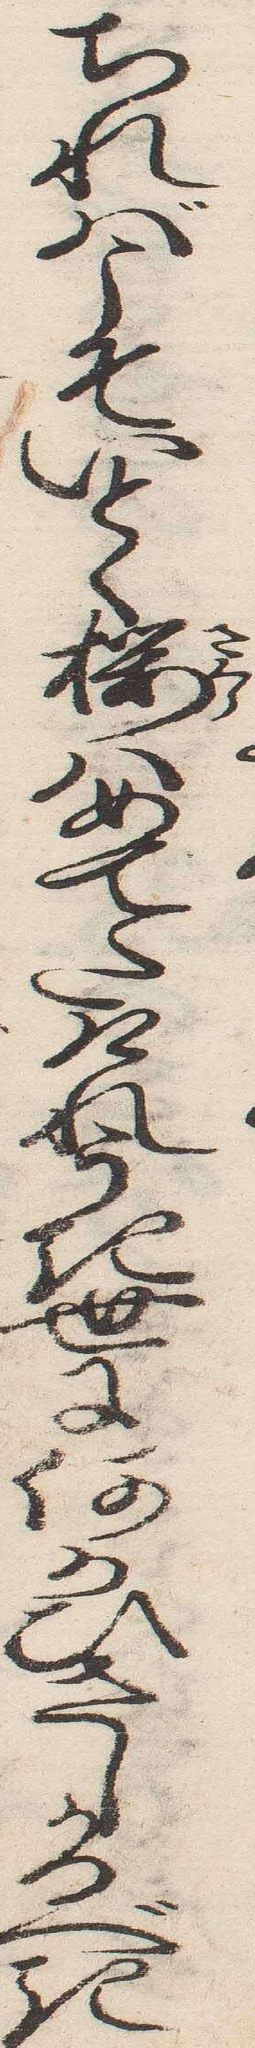ちればこそいとゝ桜はめてたけれうき世に何かひさしかるべき
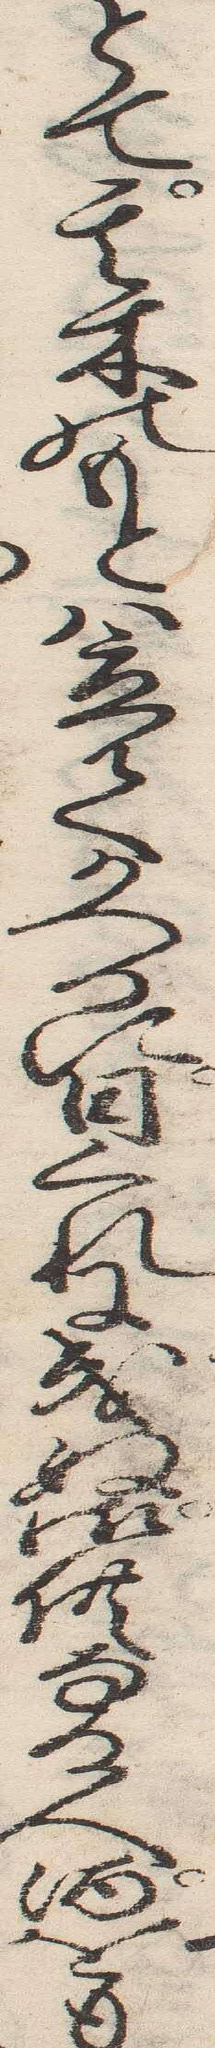とて。其木のもとは立てかへるに。日くれに成ぬ。御供なる人。酒をも
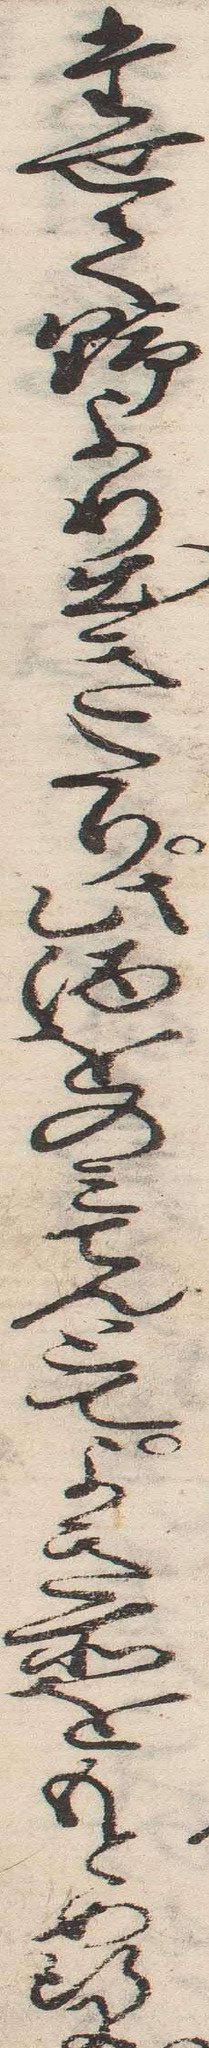たせて野より出きたり。此酒をのみてんとて。よき所をもとめ行に。

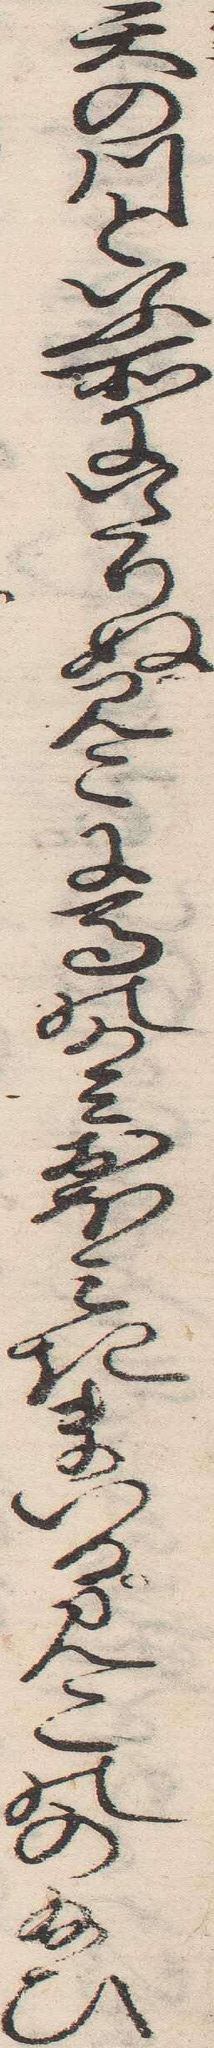天の川といふ所にいたりぬ。みこに馬のかみおほみきまいる。みこのの給ひ
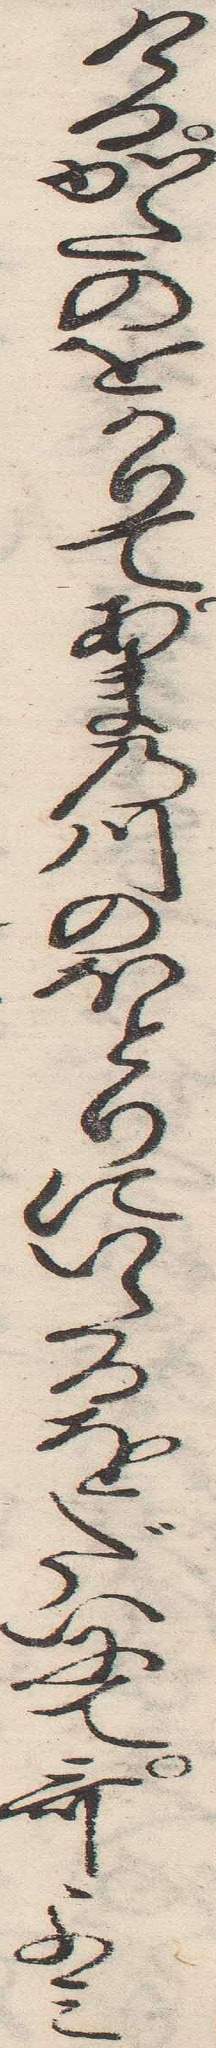ける。かたのをかりて。あまの川のほとりにいたるをだいにて。哥よみ
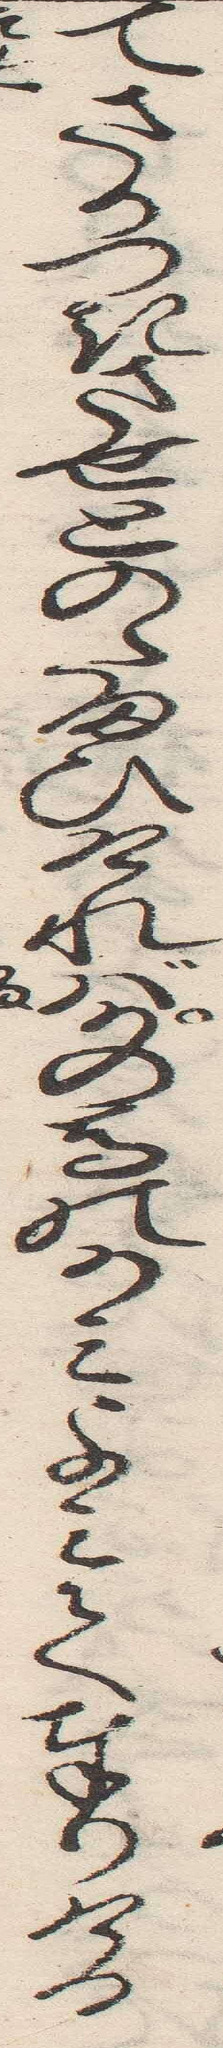てさかつきさせとのたまひければ。かの馬のかみよみて奉りける
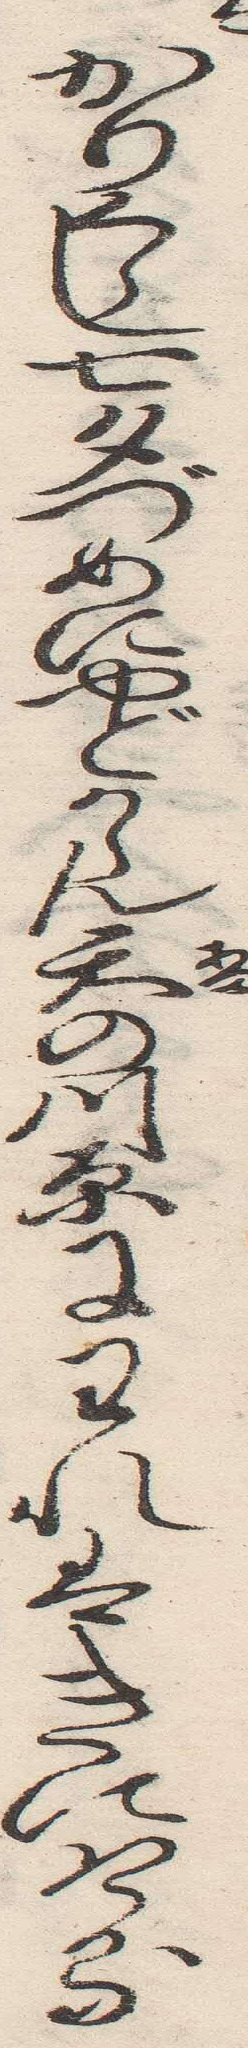古今かりくらし七夕づめにやどからん天の川原にわれはきにける
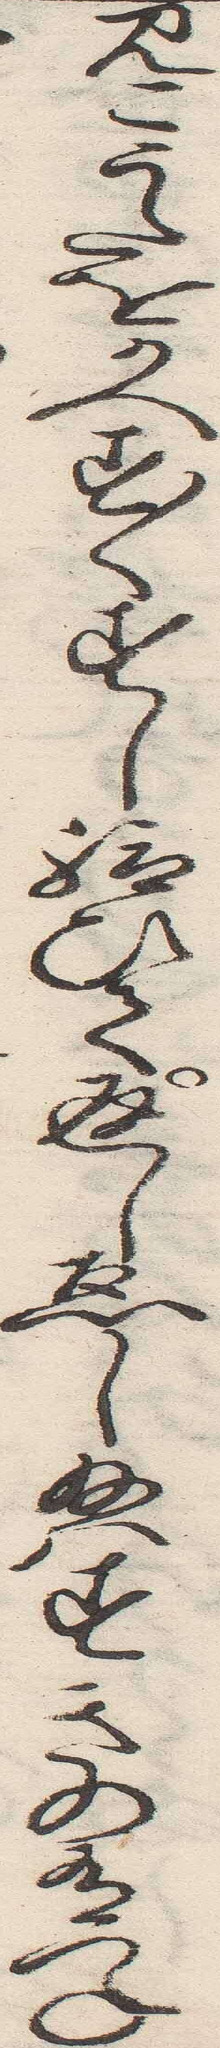みこうたをかへす〳〵すし給ひて。返しゑし給はすきの有つね
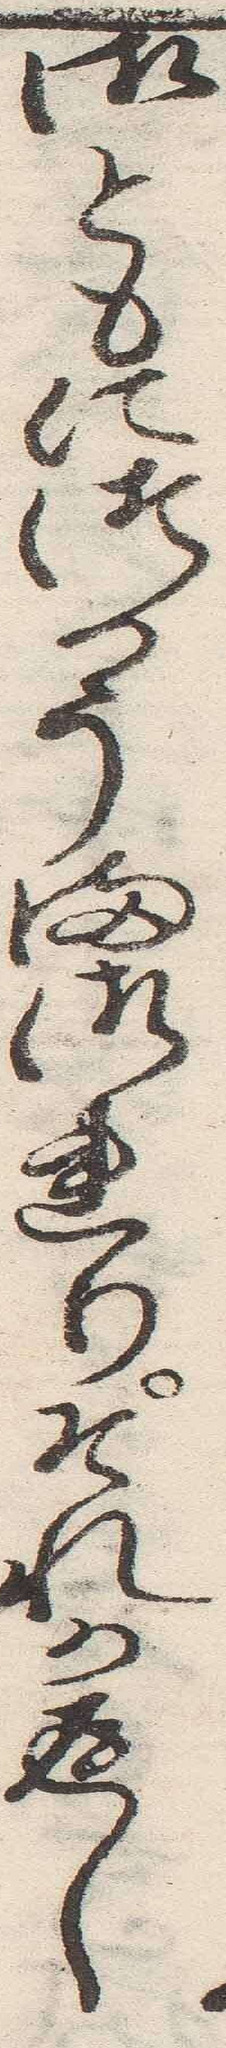御ともにつかうまつれり。それか返し
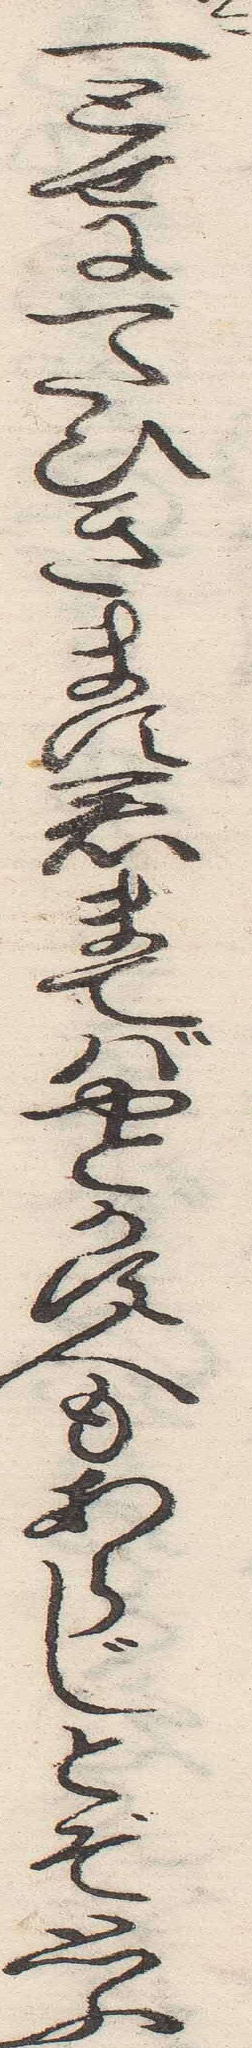古今一とせに一たひきます君まてばやとかす人もあらじとぞ思ふ
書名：伊勢物語
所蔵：東京学芸大学附属図書館 国文学研究資料館
